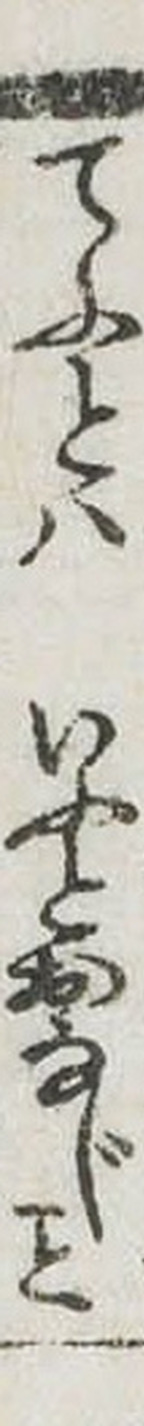てふとはいふとおなじこと
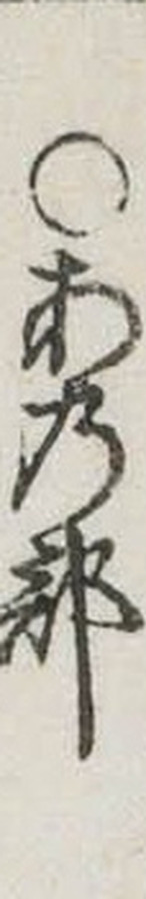○あの部
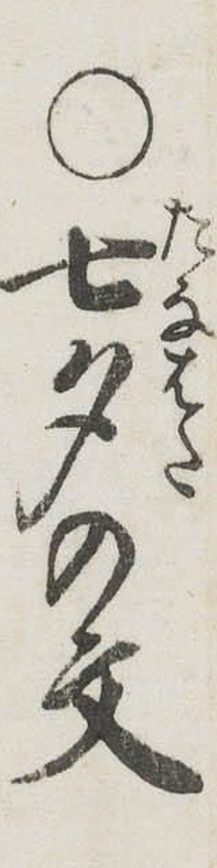○七夕の文
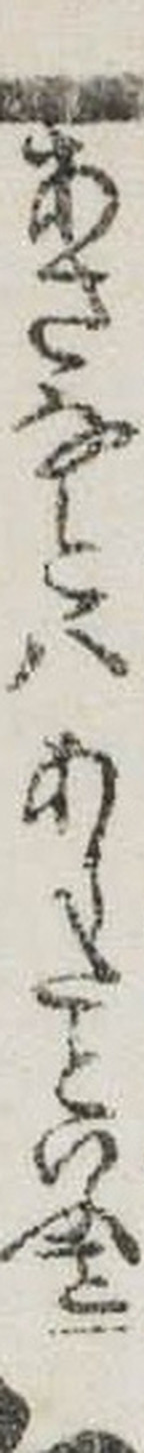あさなとはあしたといふこと
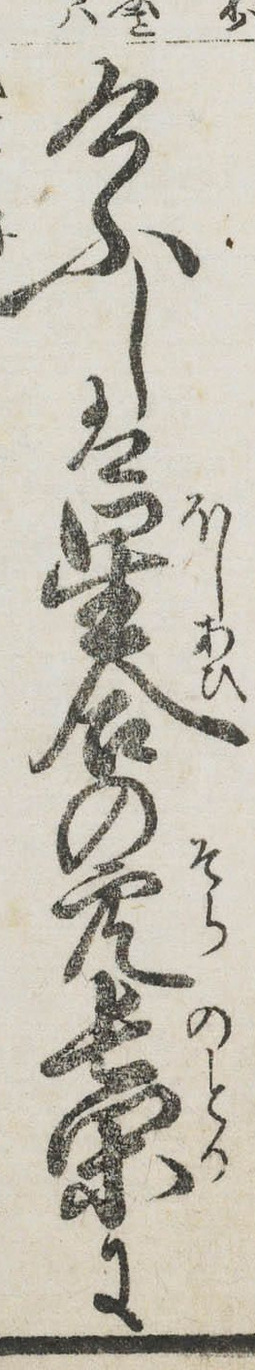けふしは星合の空長閑に
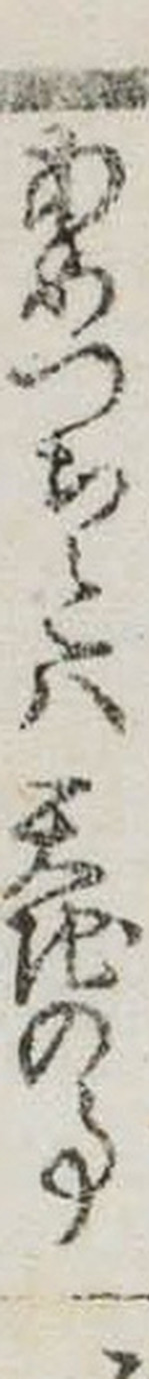あめつちとは天地の事
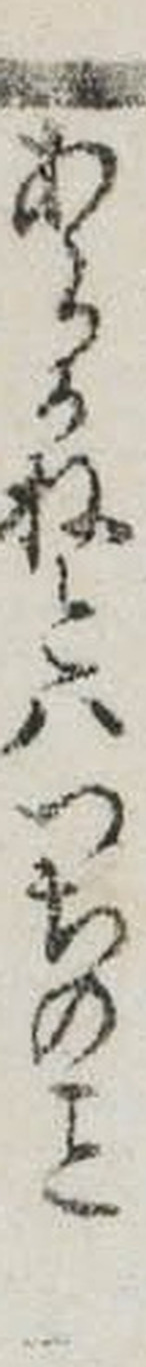あらかねとはつちのこと
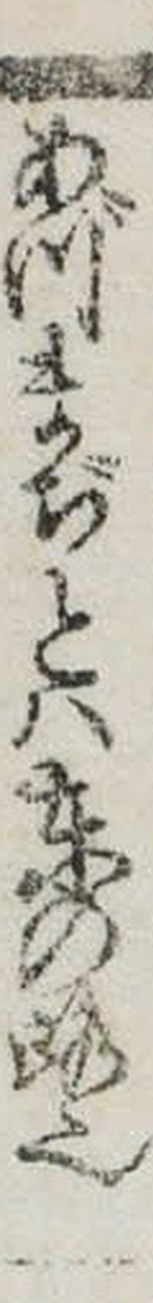あづまぢとは東の路也
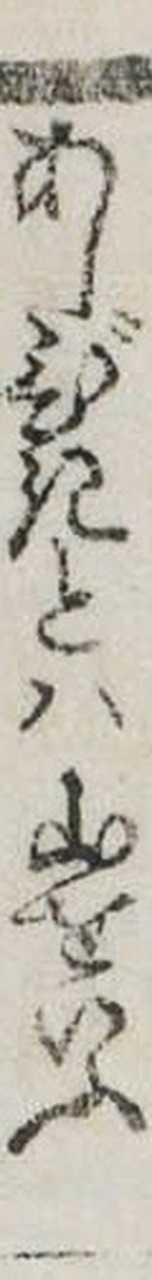あしびきとは山をいふ
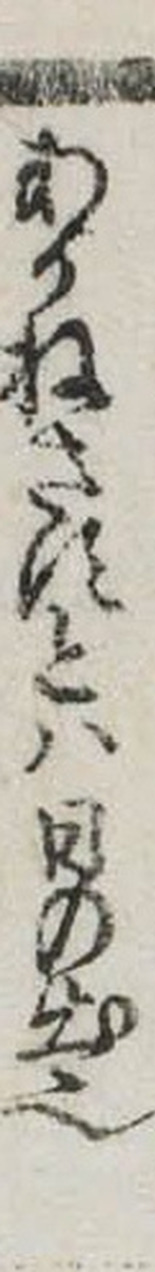あかねさすとは日の出也
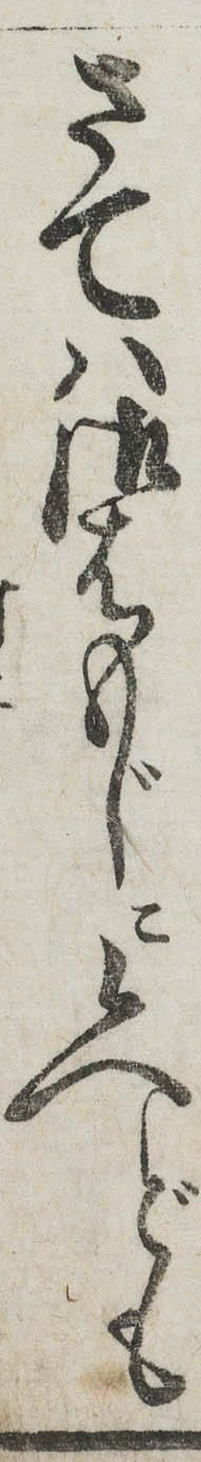さては御はもじに候へども
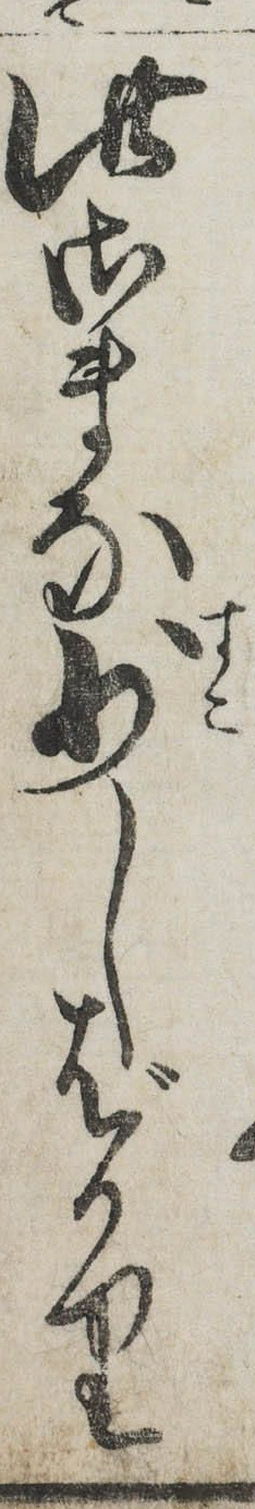此御まな少しばかり
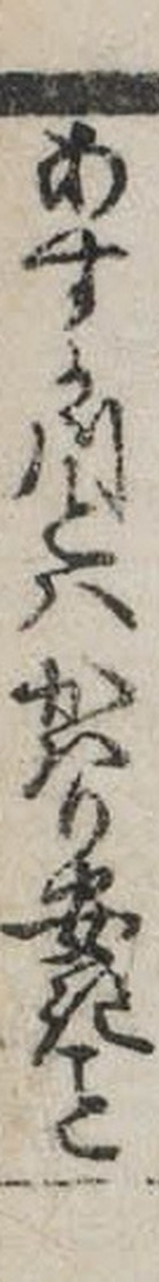あすか川とはかはり安きこと

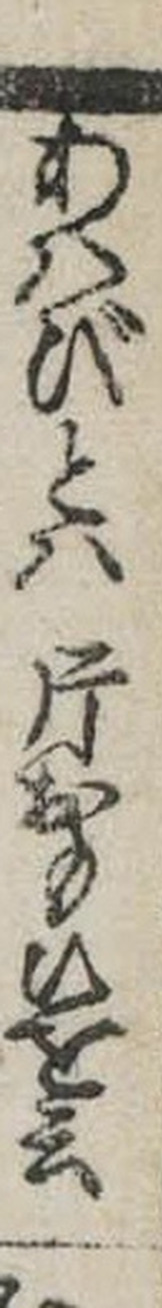あはびとは片おもひを云
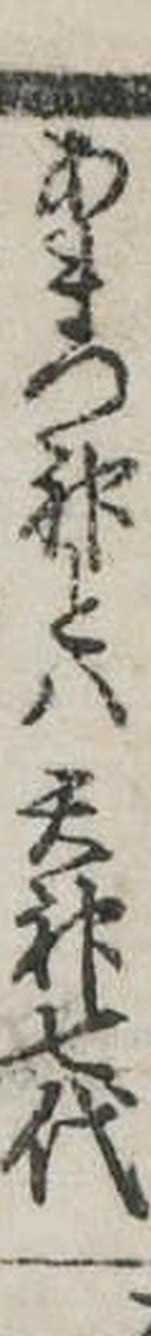あまつ神とは天神七代
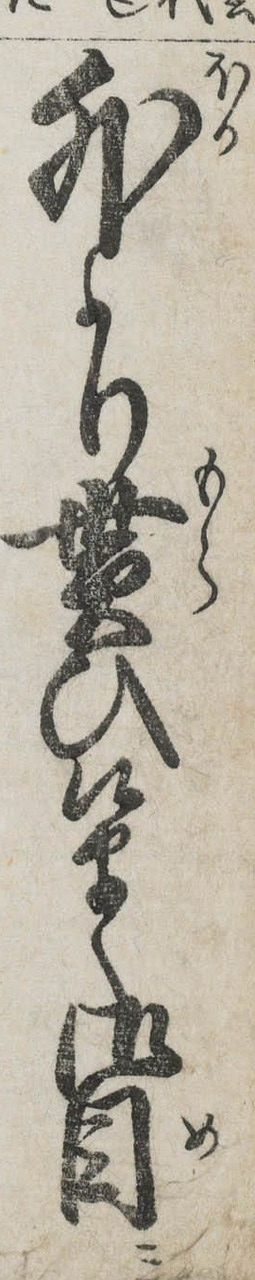外より貰ひ候まゝ御目に
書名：頭書萬用婦人手紙之文言
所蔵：東京学芸大学教育コンテンツアーカイブ
